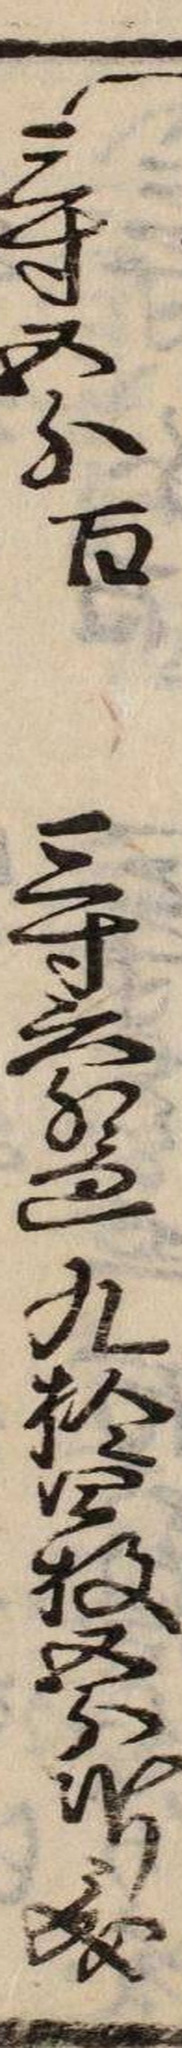三寸五分百三寸六分に廻九拾四枚五分弐りに成
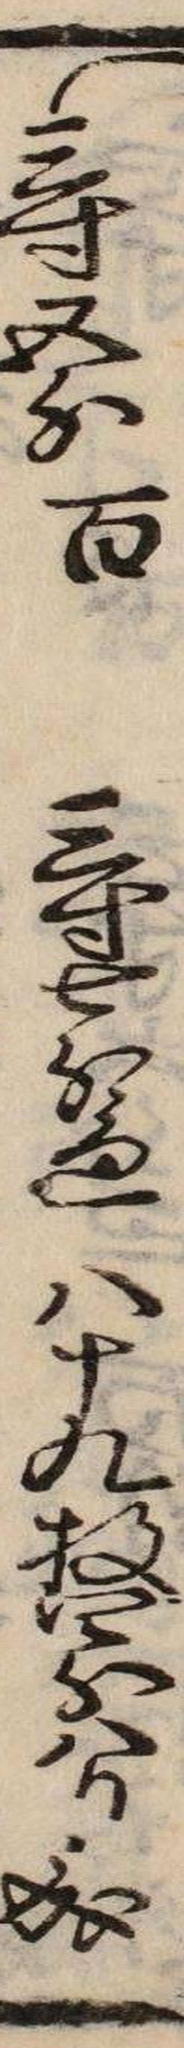三寸五分百三寸七分に廻八十九枚四分八りに成
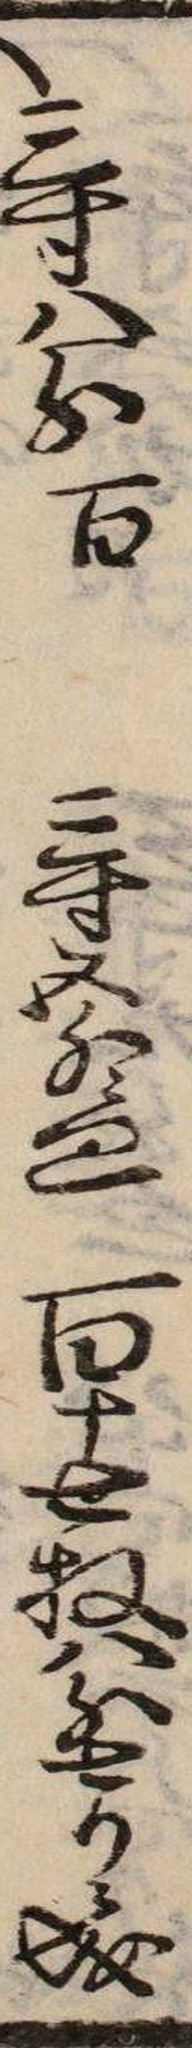三寸八分百三寸五分に廻百十七枚八分七りに成
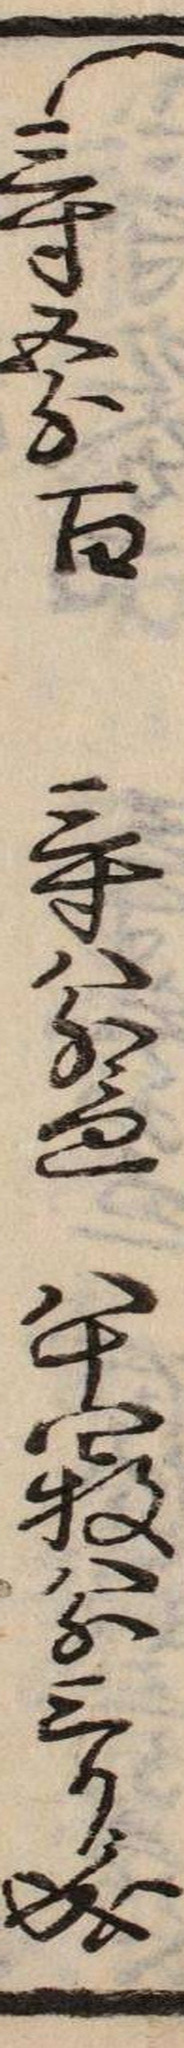三寸五分百三寸八分に廻八十四枚八分三りに成
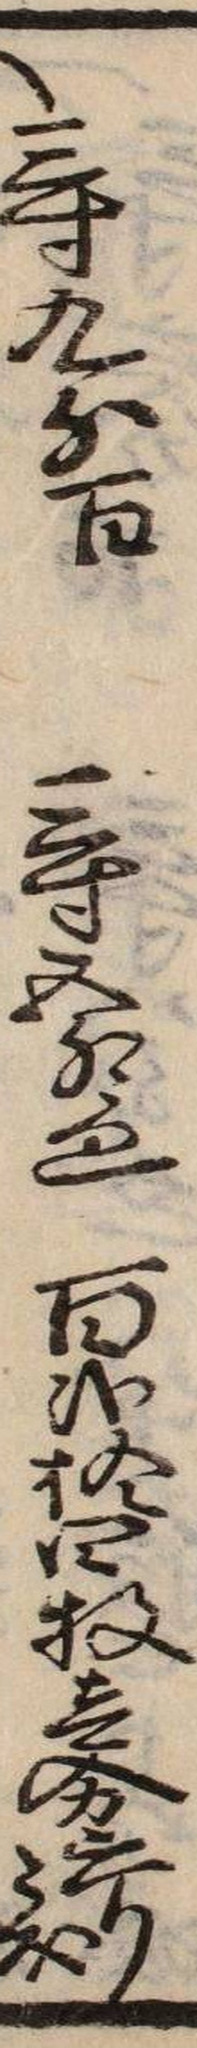三寸九分百三寸五分に廻百弐拾四枚壱分六りに成
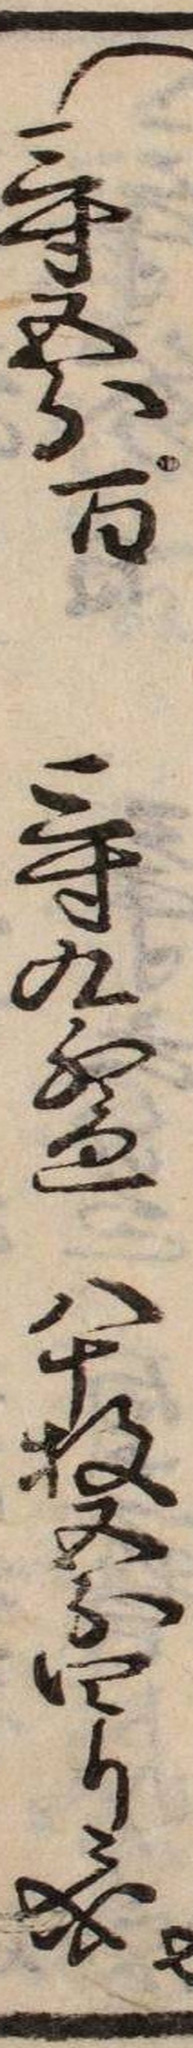三寸五分百三寸九分に廻八十枚五分四りに成
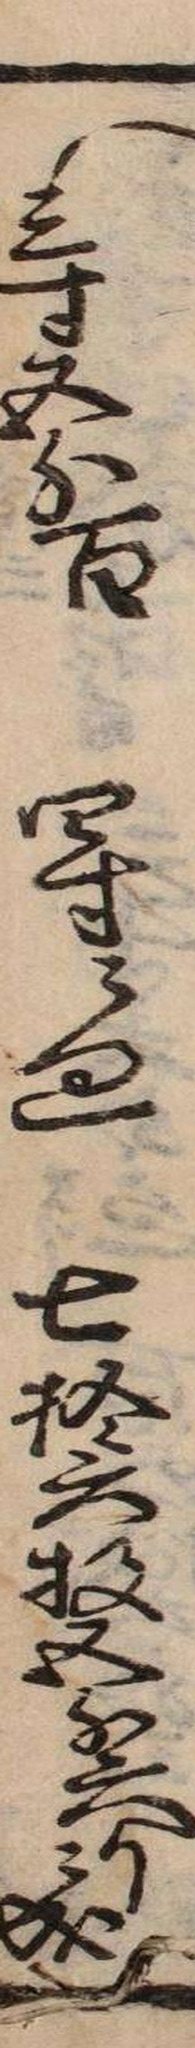三寸五分百四寸に廻七拾六枚五分六りに成

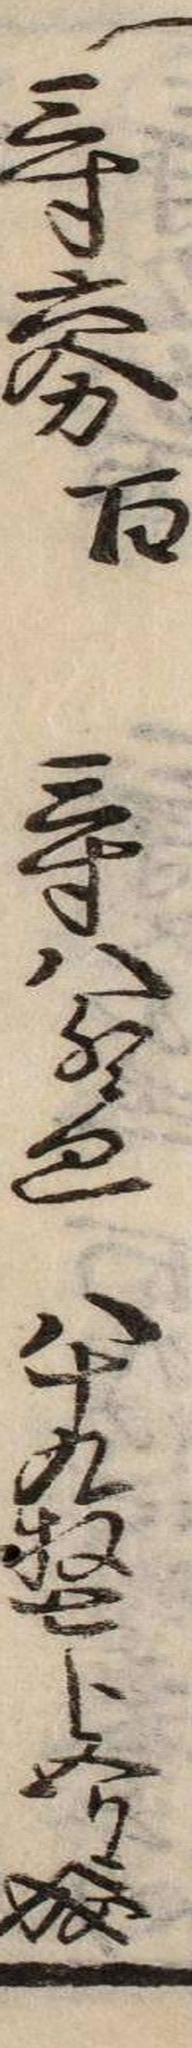三寸六分百三寸八分に廻八十九枚七分五りに成
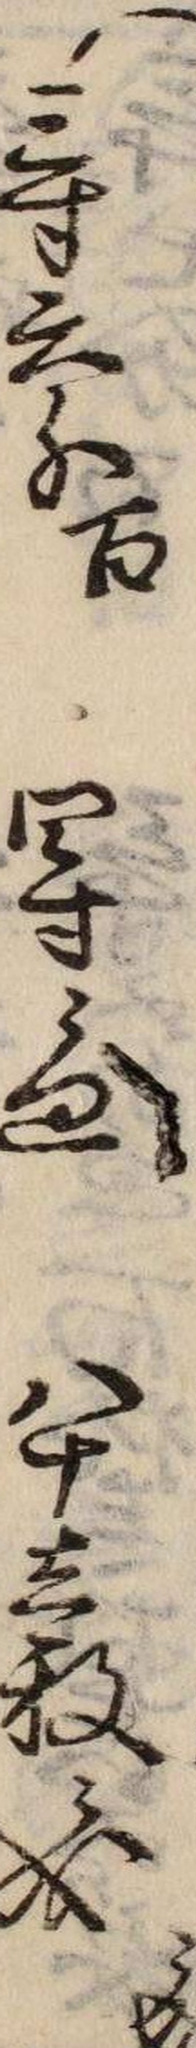三寸六分百四寸に廻八十三枚に成
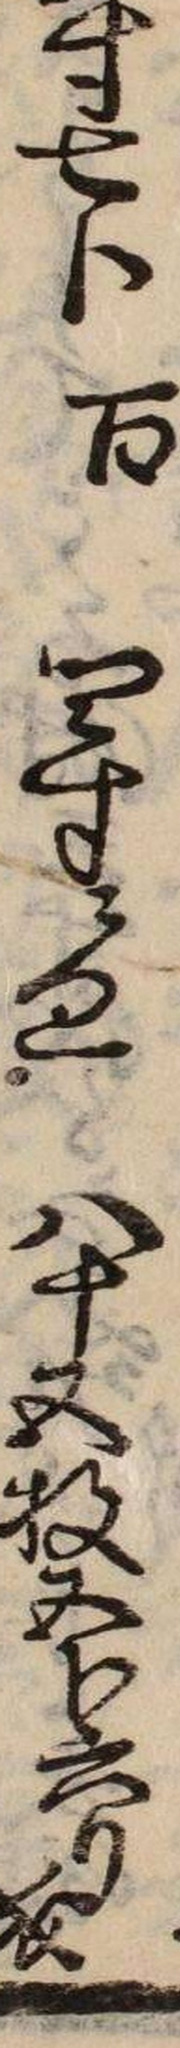三寸七分百四寸に廻八十五枚五分六りに成
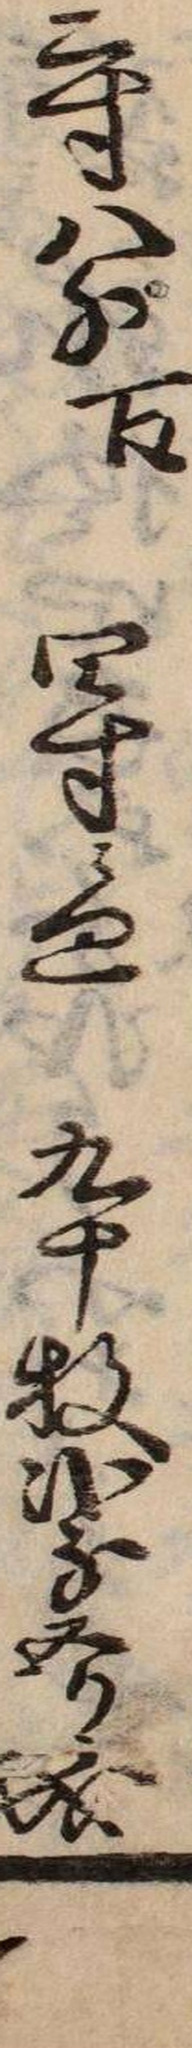三寸八分百四寸に廻九十枚弐分五りに成

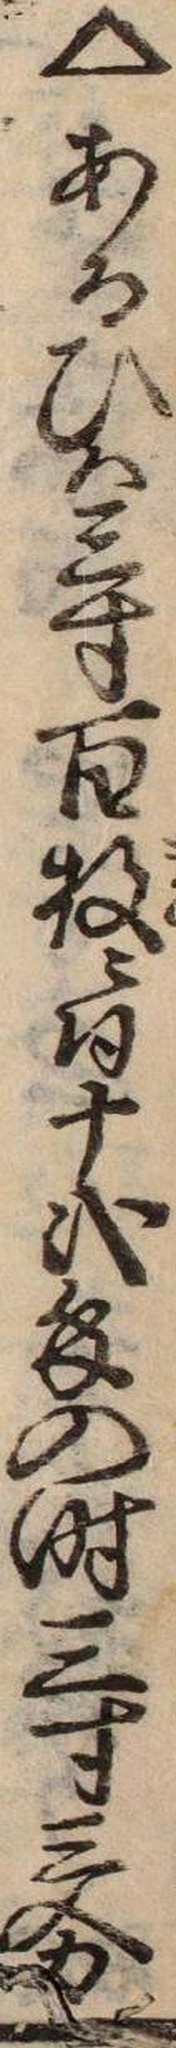△あるひは三寸百枚に付十弐匁の時三寸三分
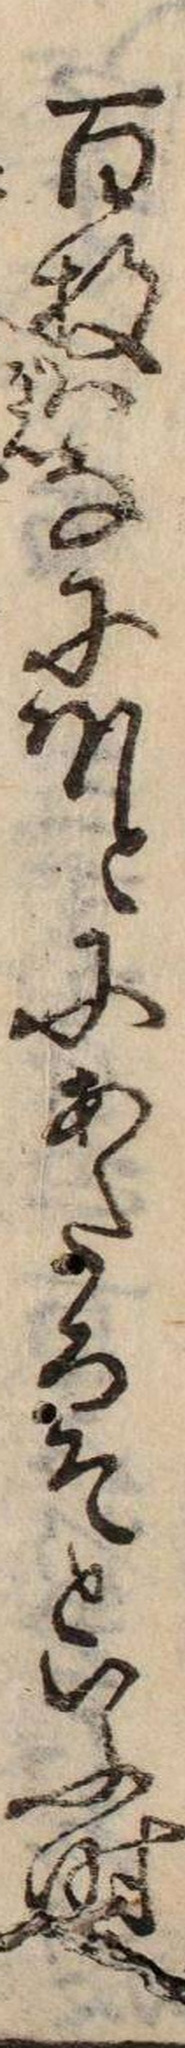百枚はなにほとにあたるそといふ時
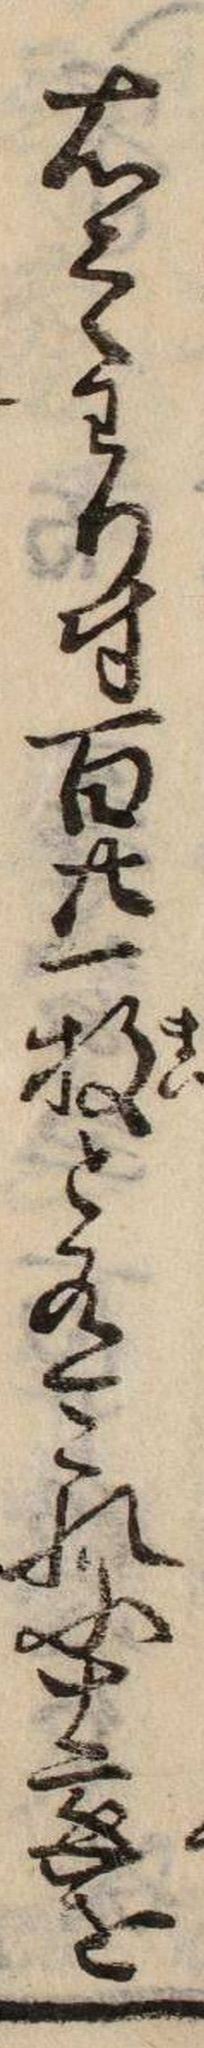右のわり付百廿一枚と有これに十二匁を
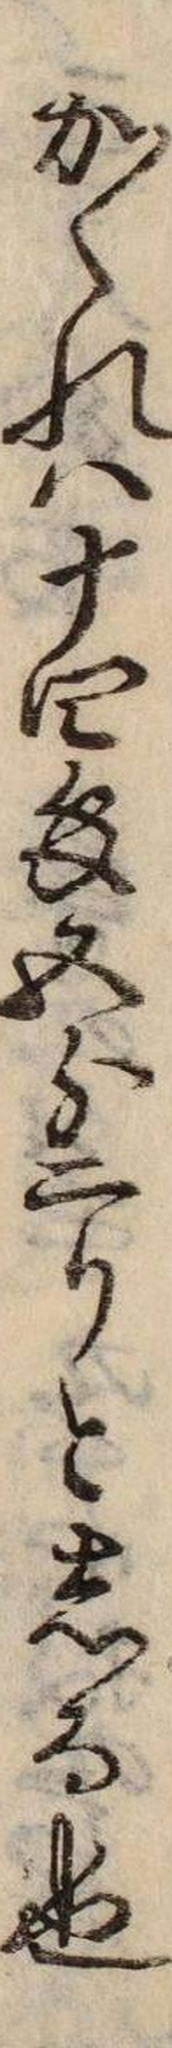かくれは十四匁五分二りとしる也
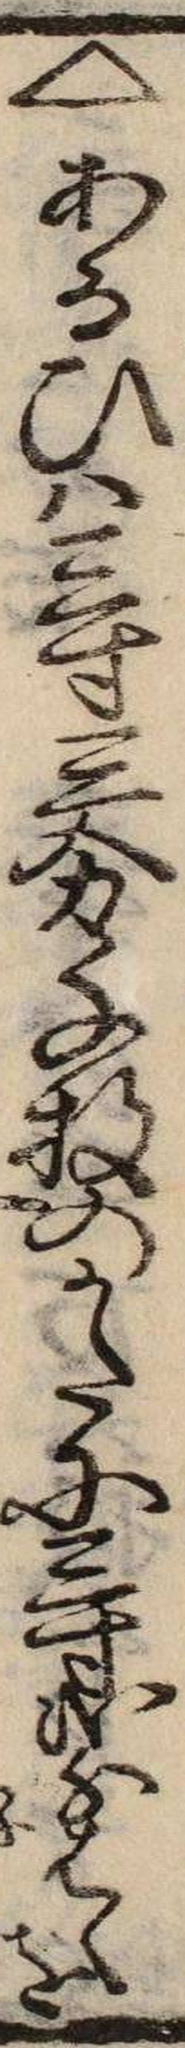△あるひは三寸三分千枚のかたに三寸弐分はくを
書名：塵劫記（寛永11年自跋、京都府立京都学・歴彩館追貴8）
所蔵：京都府立京都学・歴彩館 国文学研究資料館
